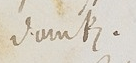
danken.
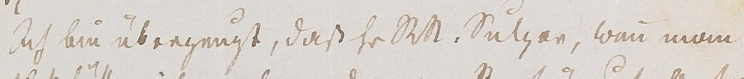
Ich bin überzeugt, dass Hr RR. Sulzer, wenn man
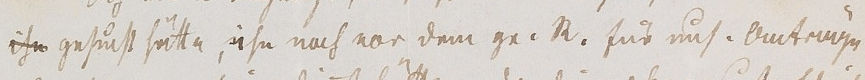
ihn gesucht hätte, ihn noch vor dem gr. R. für uns. Anträge
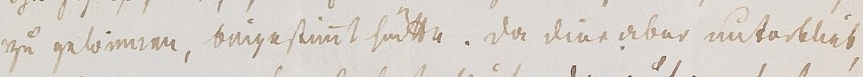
zu gewinnen, beigestimmt hätte. Da dies aber unterblieb,
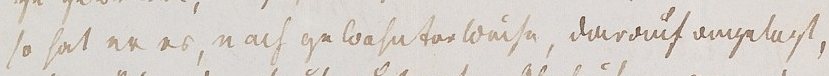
so hat er es, nach gewohnter Weise, darauf angelegt,
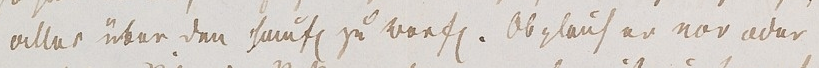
alles über den Haufen zu werfen. Obgleich er vor oder
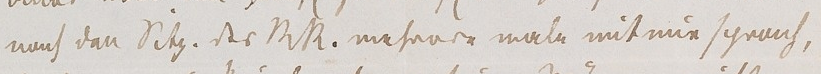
nach den Sitz. des RR. mehrere male mit mir sprach,
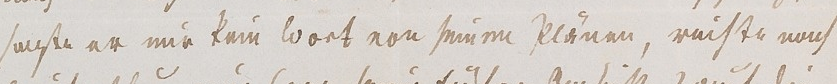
sagte er mir kein Wort von seinen Plänen, reiste nach
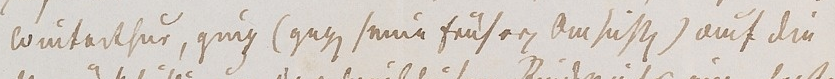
Winterthur, ging (ganz seine früheren Ansichten) auf die
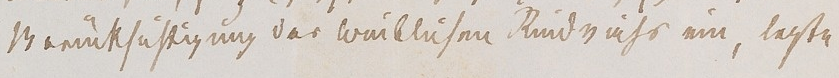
Berücksichtigung des weiblichen Rindviechs ein, legte
